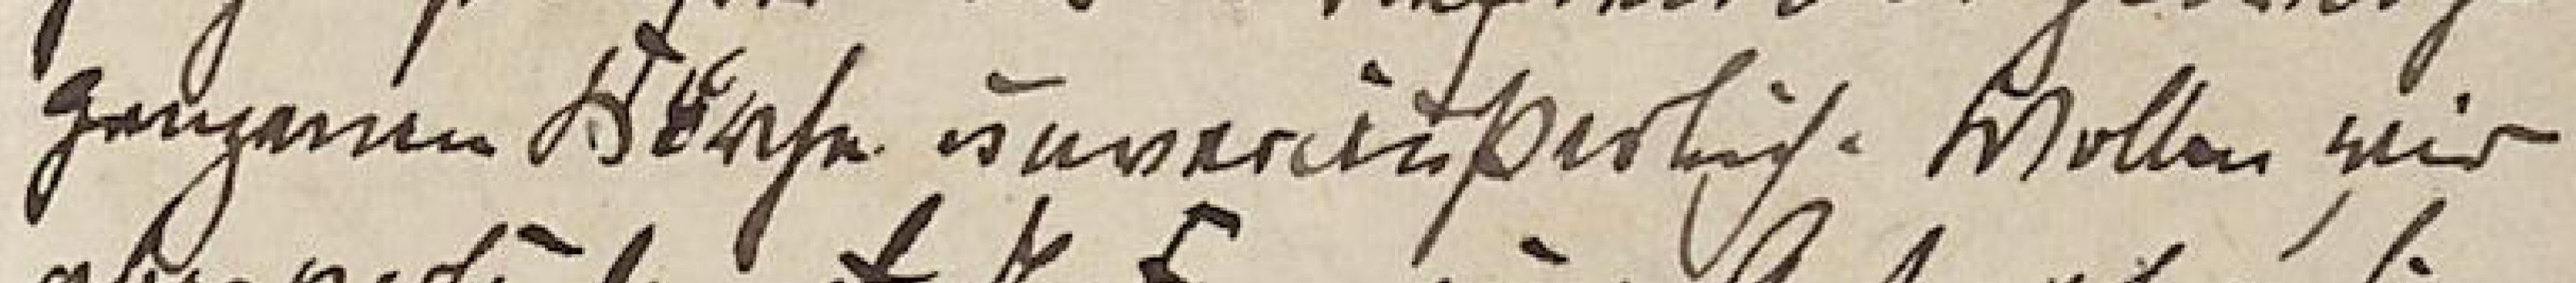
gangenen Kirche unveräußerlich. Wollen wir
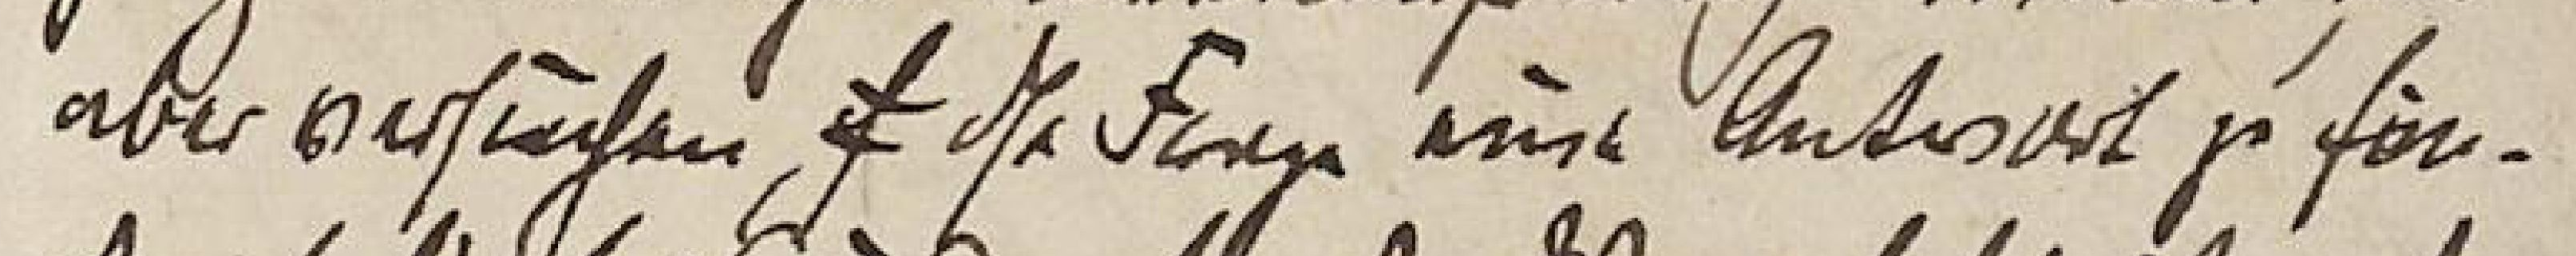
aber versuchen, f dse Frage eine Antwort zu fin¬
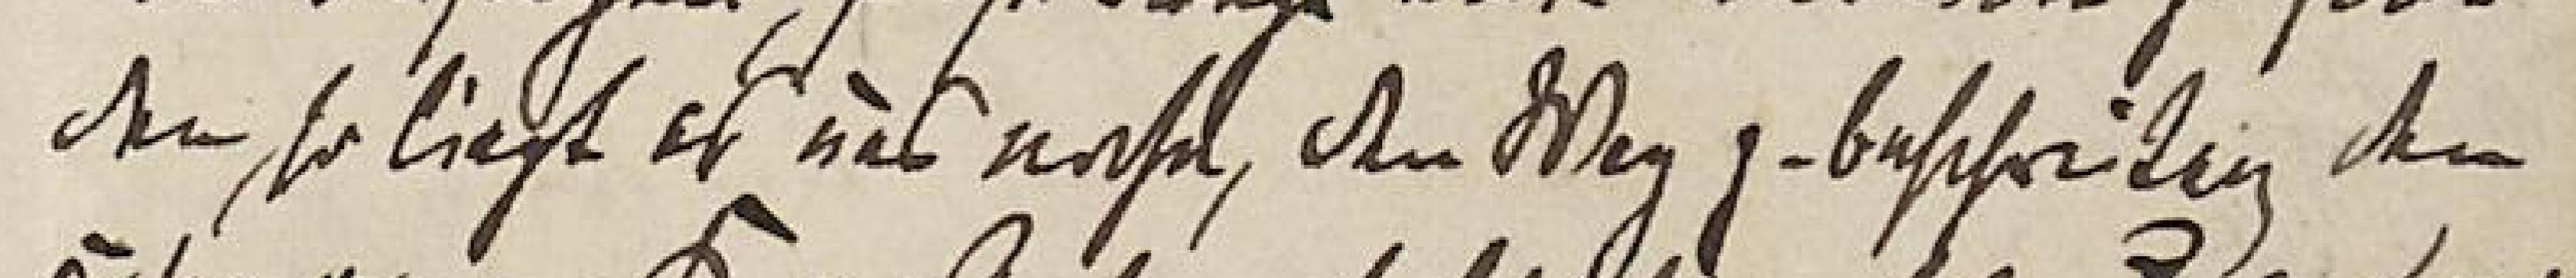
den, so liegt es uns nahe, den Weg z. beschreiten, den
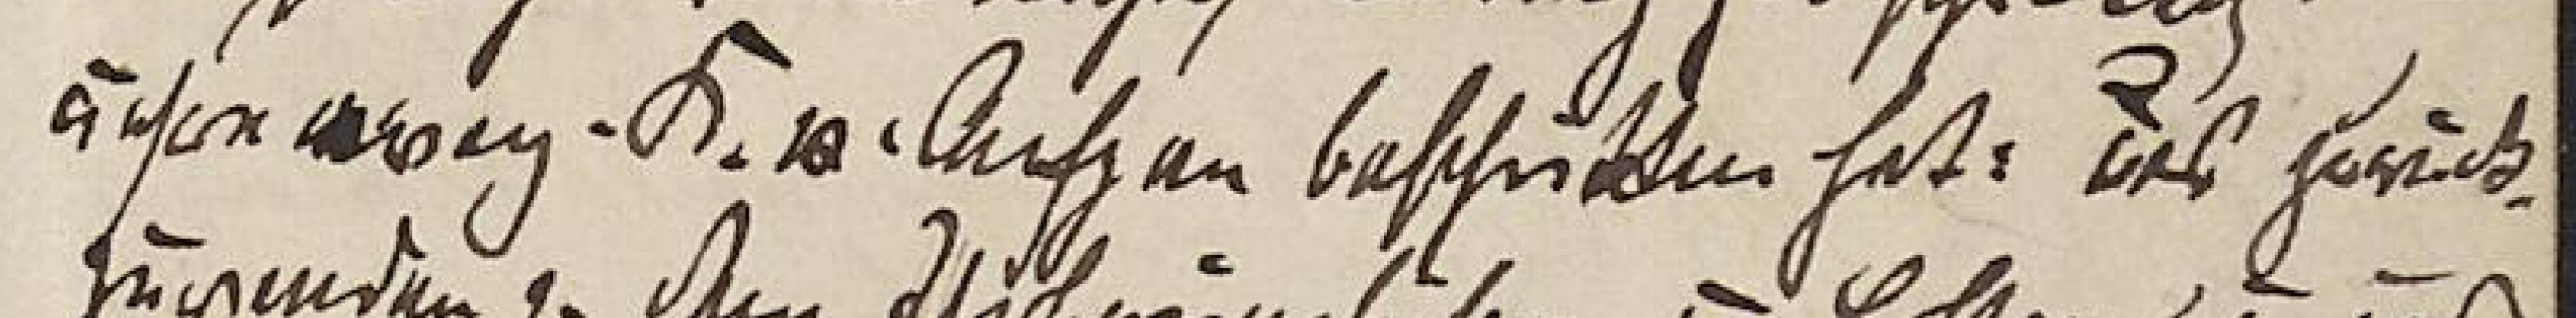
unsre evang. K. v. Anfg an beschritten hat: uns zurück¬
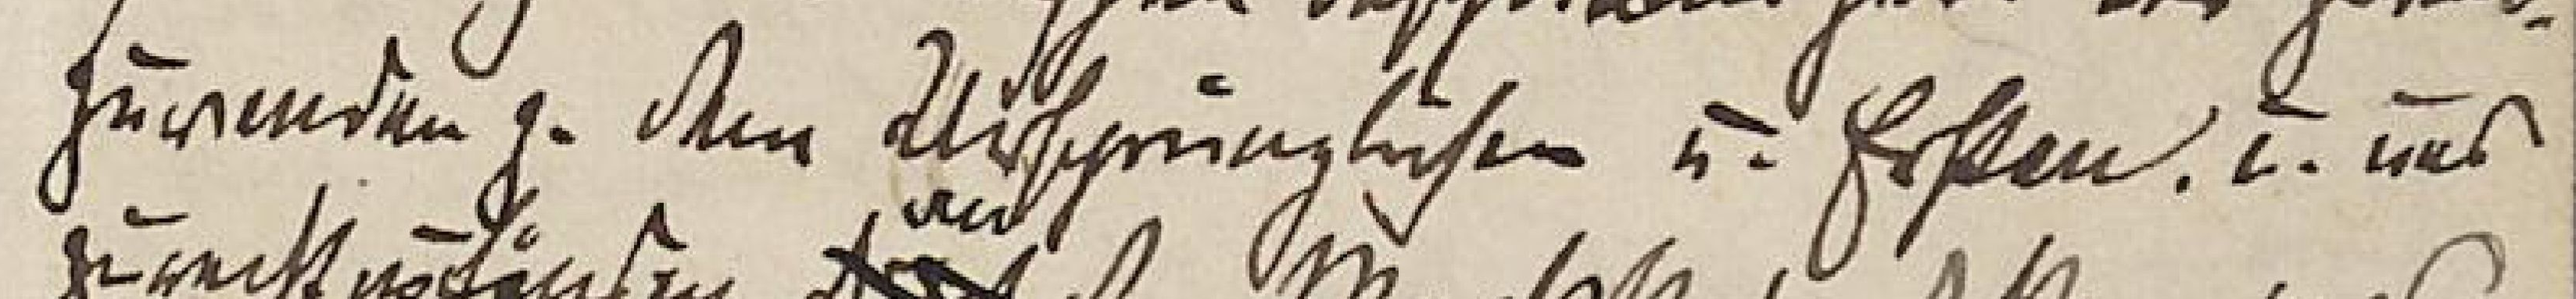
zuwenden z. dem Ursprünglichen u. Ersten u. uns
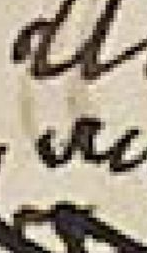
an
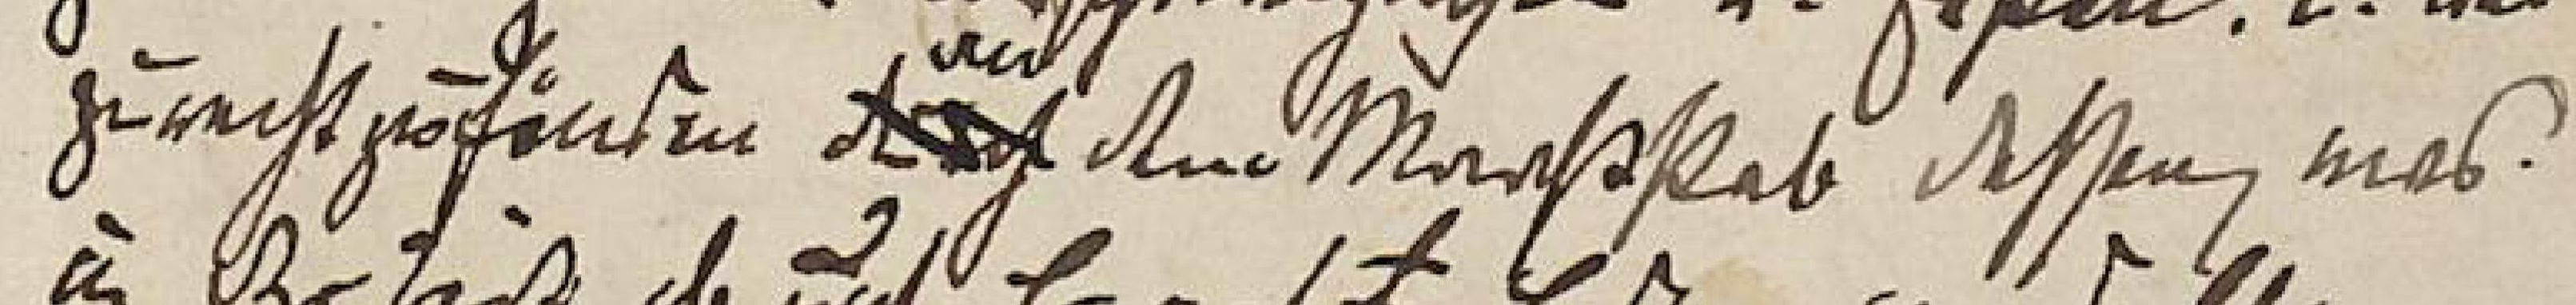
zurechzufänden durch dan Maaßstab dessen, was
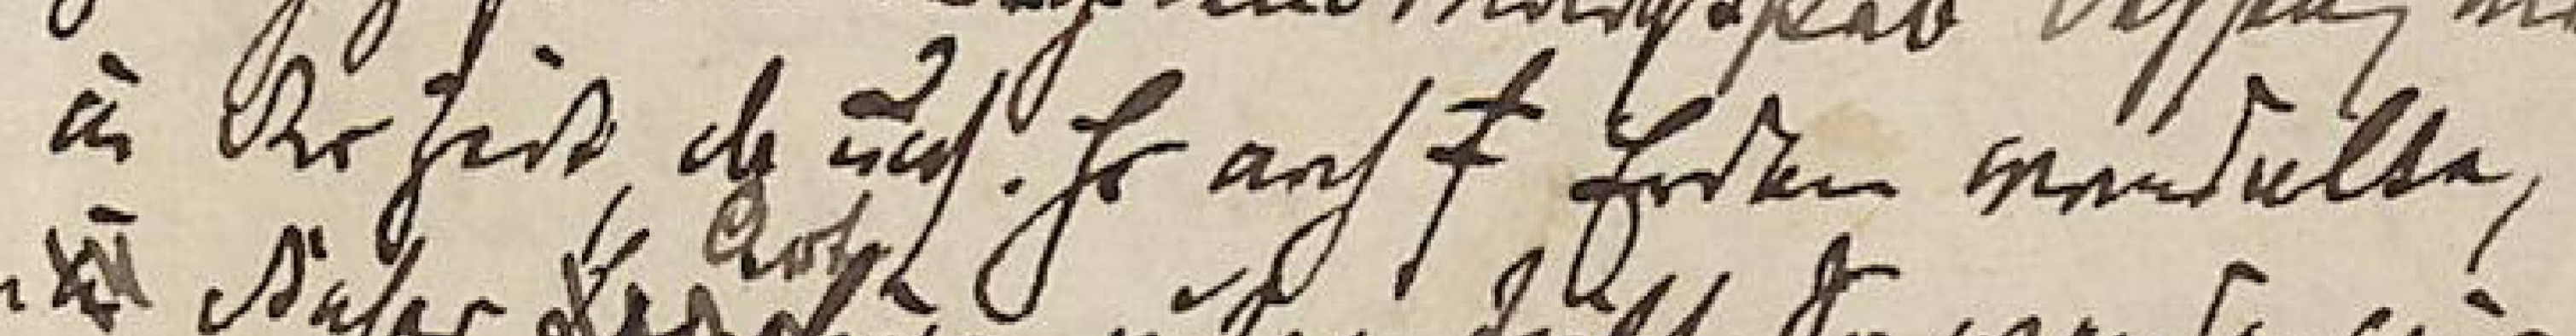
in der Zeit da uns. Hr. noch f. Erden wandelte,
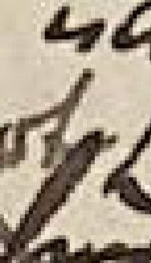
Ort
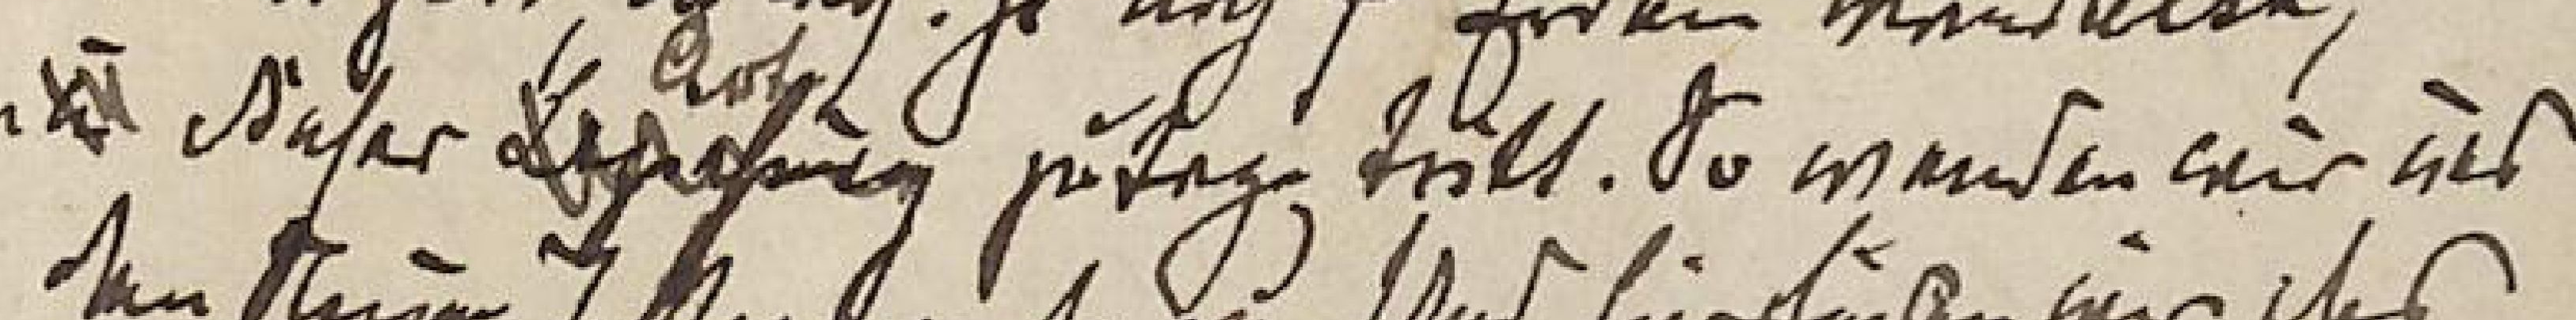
in dieser Begegenung zutage tritt. So wenden wir uns
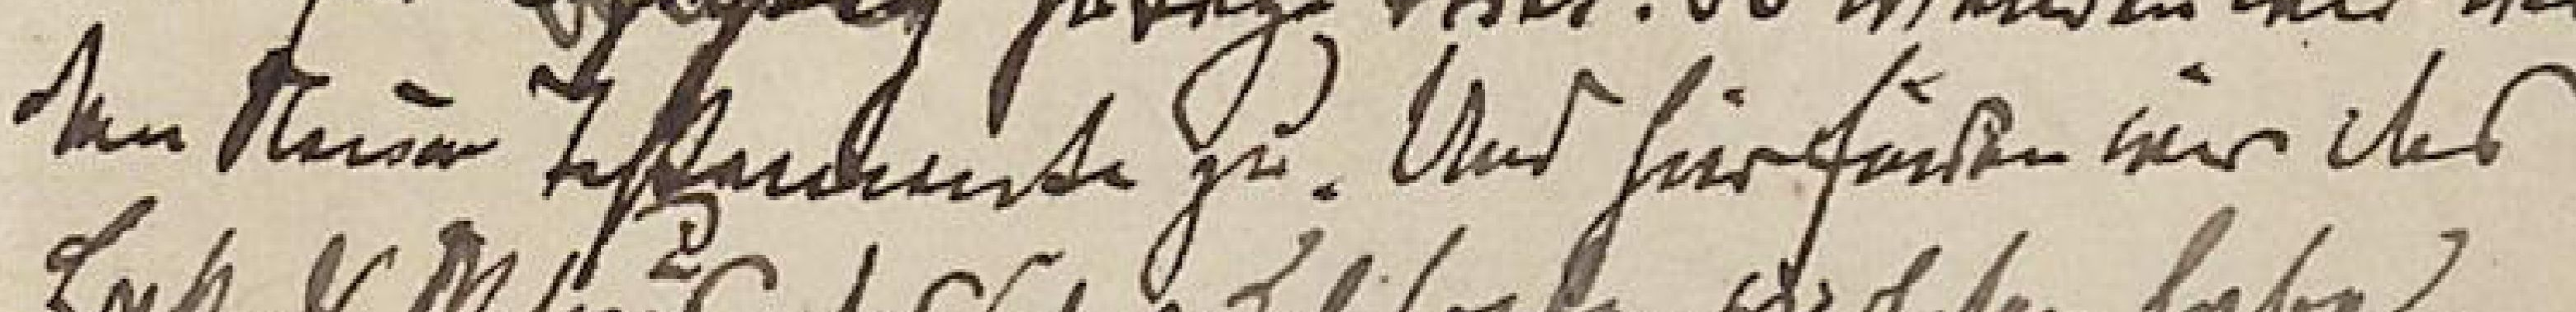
dem Neuen Testamente zu. Und hier finden wir das
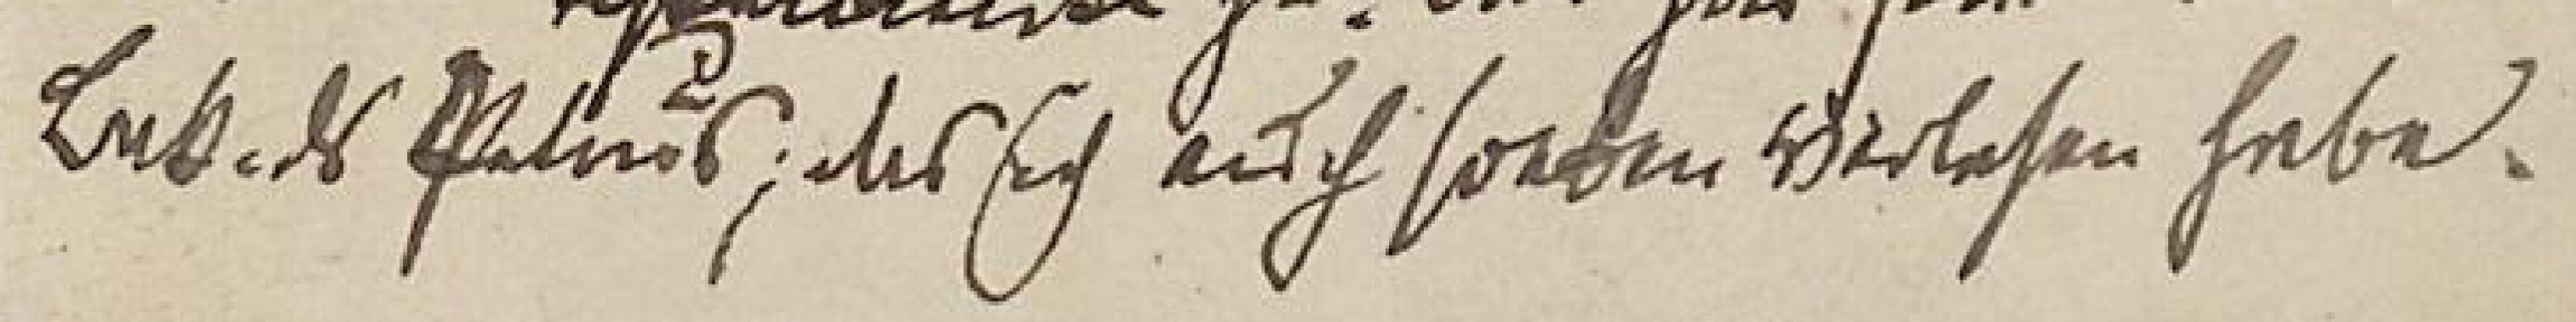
Bek. ds Petrus; das ich euch soeben verlesen habe.
